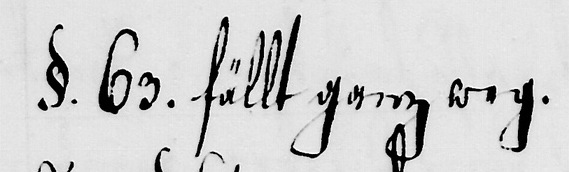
§. 63. fällt ganz weg.
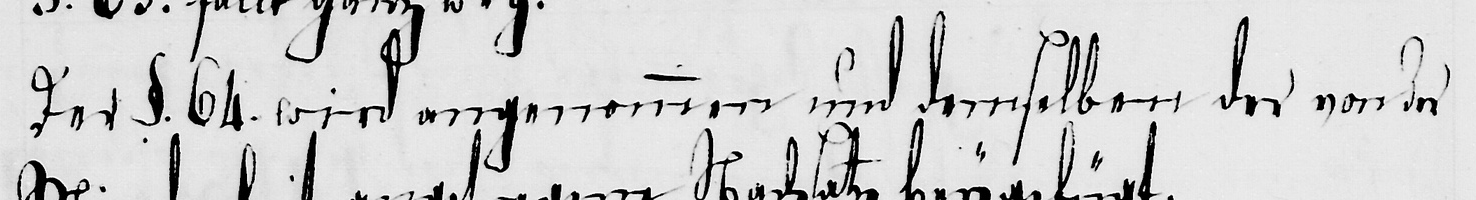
Der §. 64. wird angenommen und demselben der von der
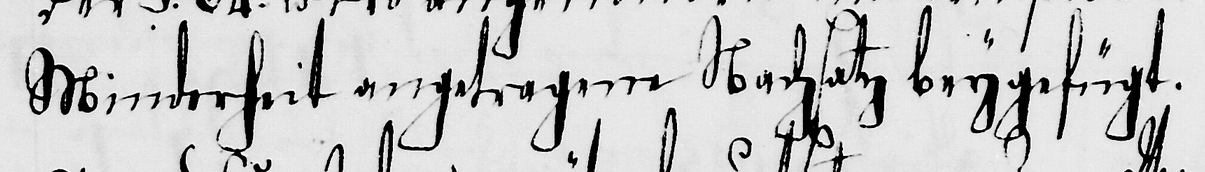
Minderheit angetragene Nachsatz beygefügt.
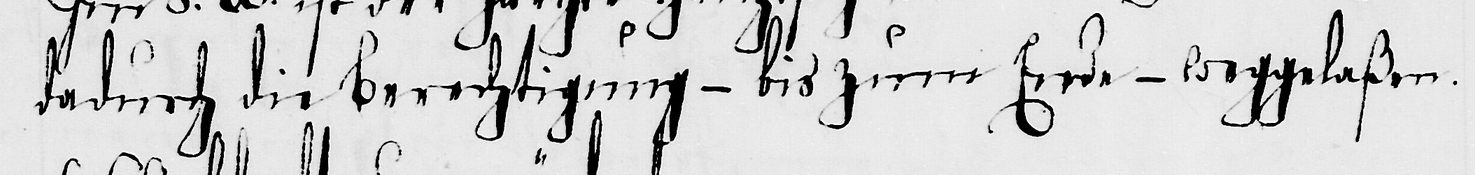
dadurch die Berechtigung – bis zum Ende – weggelaßen.
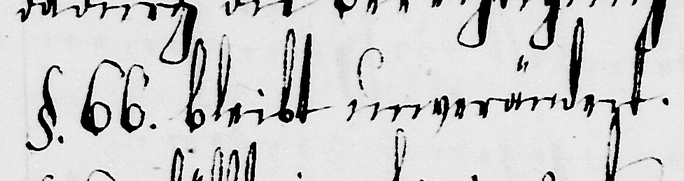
66. bleibt unverändert.
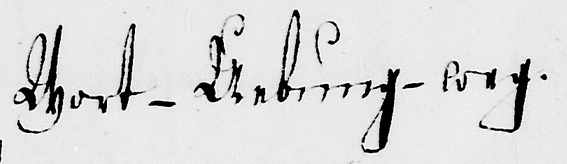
Wort – Uebung – weg.
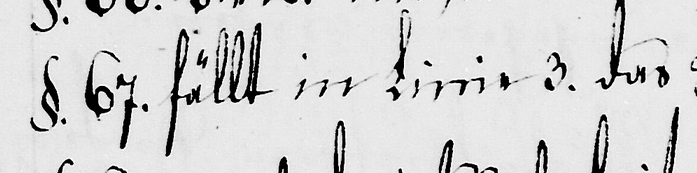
§. 67. fällt in Linie 3. das
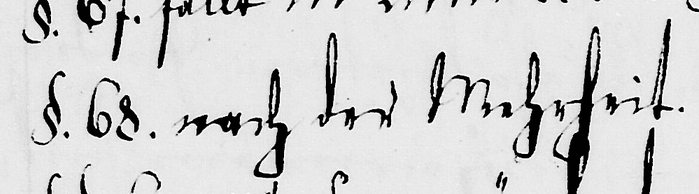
§. 68. nach der Mehrheit.
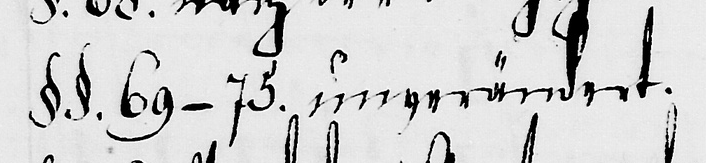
§§. 69 – 75. unverändert.
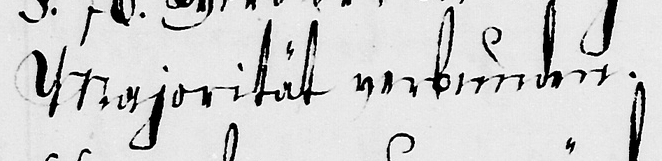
Majorität verbunden.
